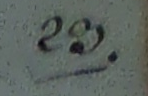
23.
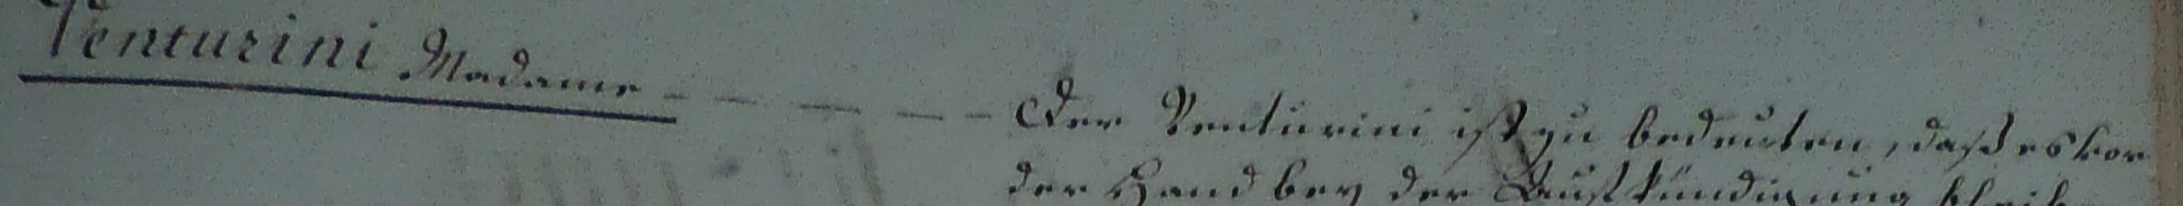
Venturini Madame _ _ _ _ _ Der Venturini ist zu bedeuten, daß es vor
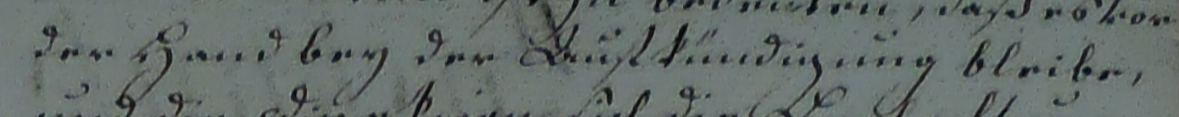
der Hand bey der Aufkündigung bleibe,
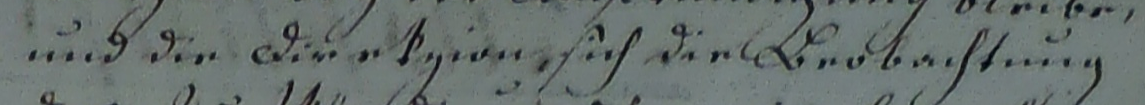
und die Direkzion sich die Beobachtung
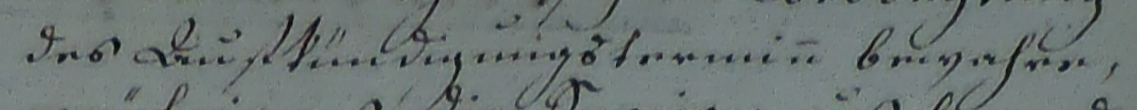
des Aufkündigungstermin bewahre,
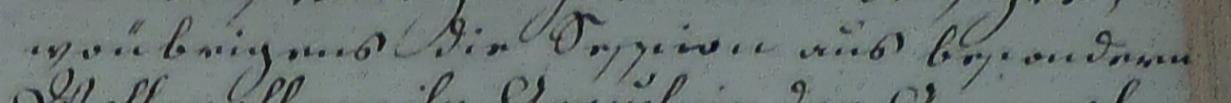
wo übrigens die Session aus besonderm
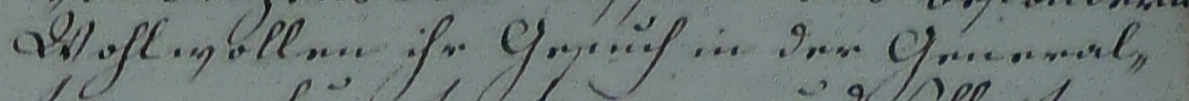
Wohlwollen ihr Gesuch in der General¬
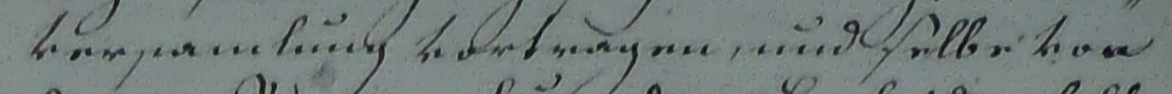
versamlung vortragen, und selbe von
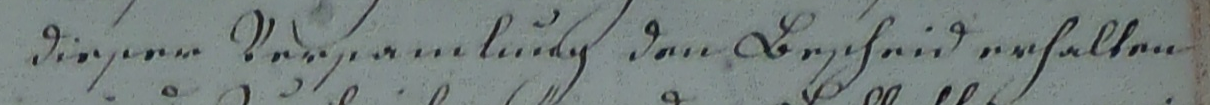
dieser Versamlung den Bescheid erhalten
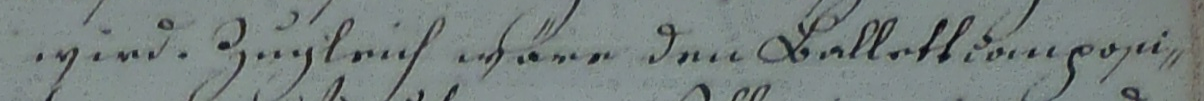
wird. Zugleich wäre den Ballettcomposi¬
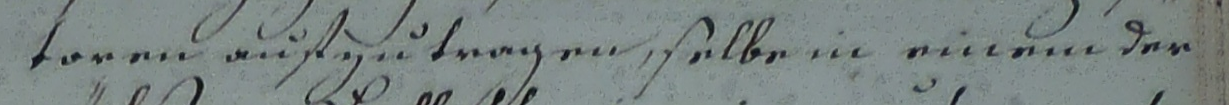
toren aufzutragen, selbe in einem der
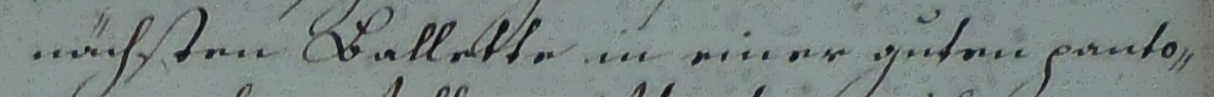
nächsten Ballette in einer guten panto¬
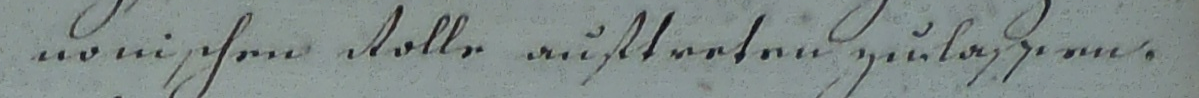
nonischen Rolle auftreten zulassen.
